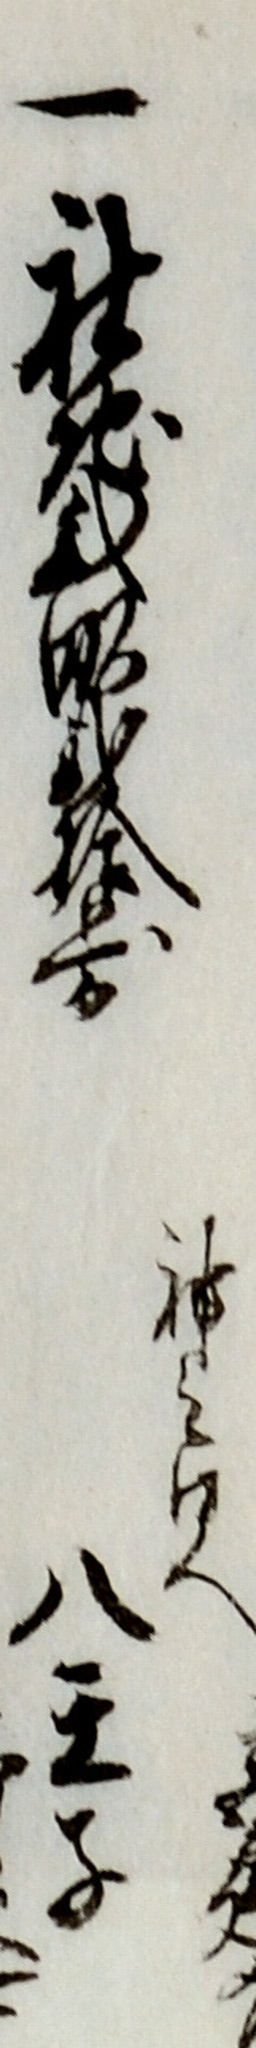一社地弐畝弐拾歩八王子
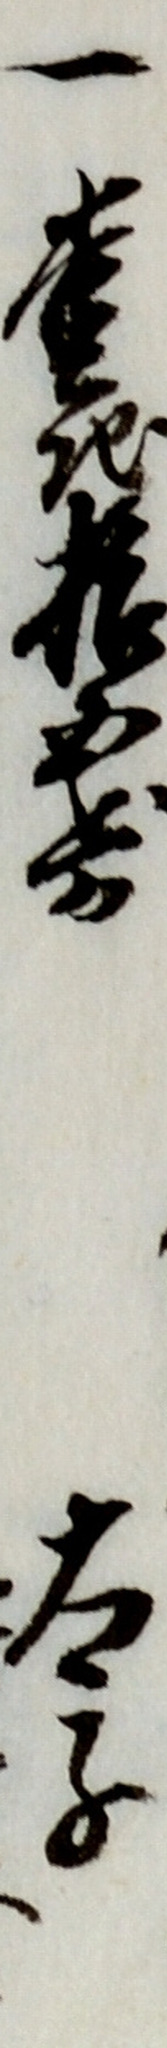一堂地拾五歩太子
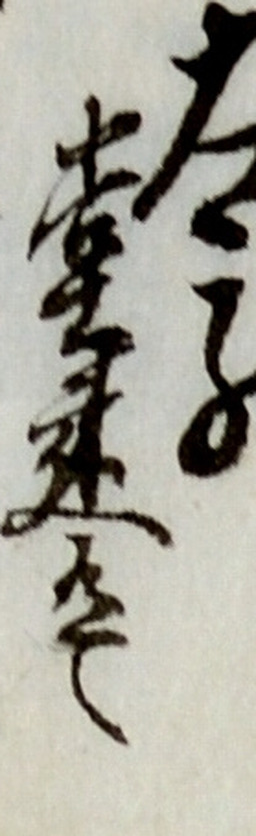堂建有之
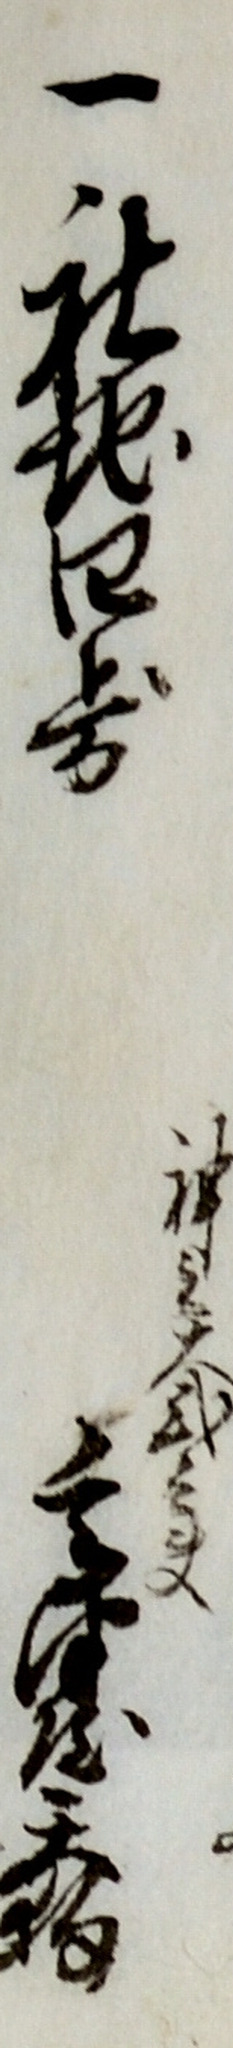一社地四歩高津屋天狗

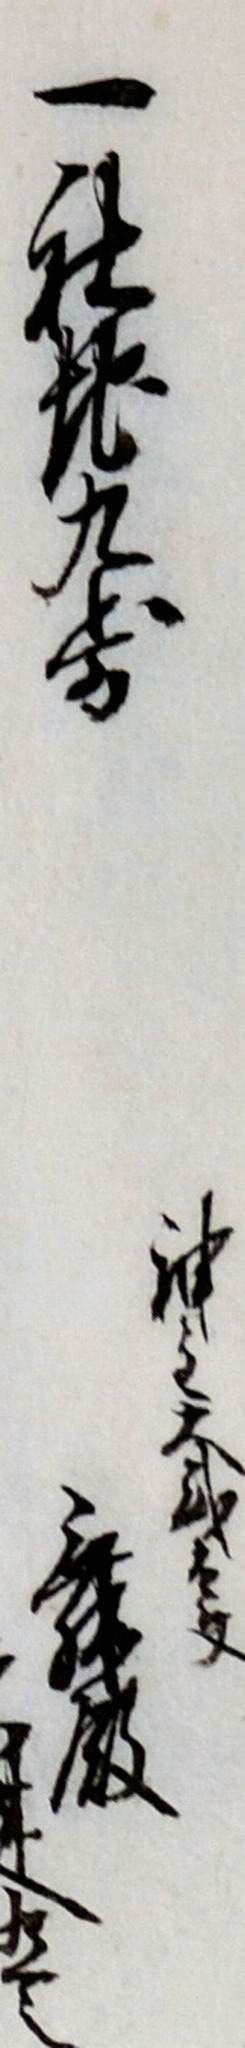一社地九歩舞殿
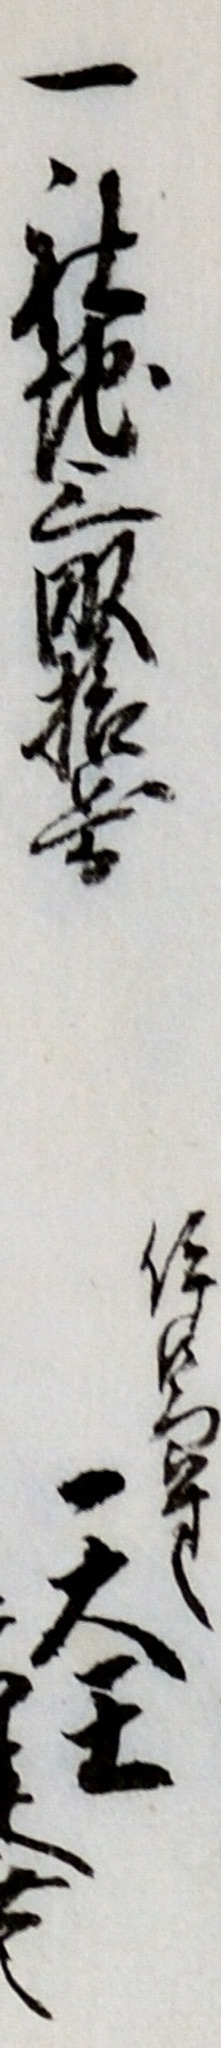一社地三畝拾歩天王
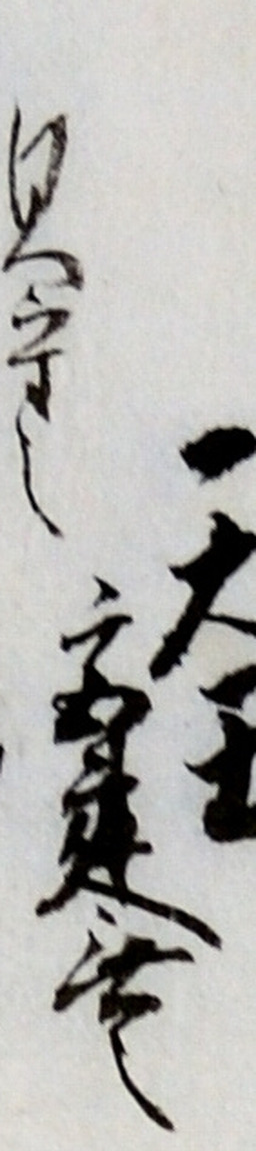宮建無之
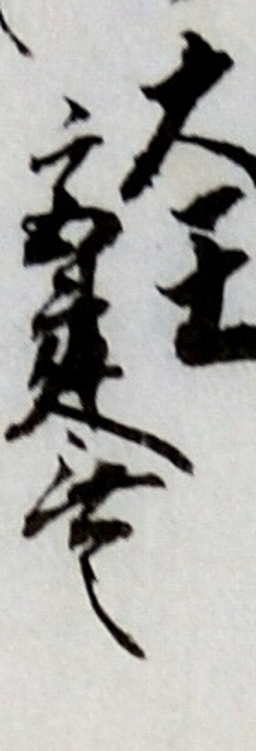宮建無之
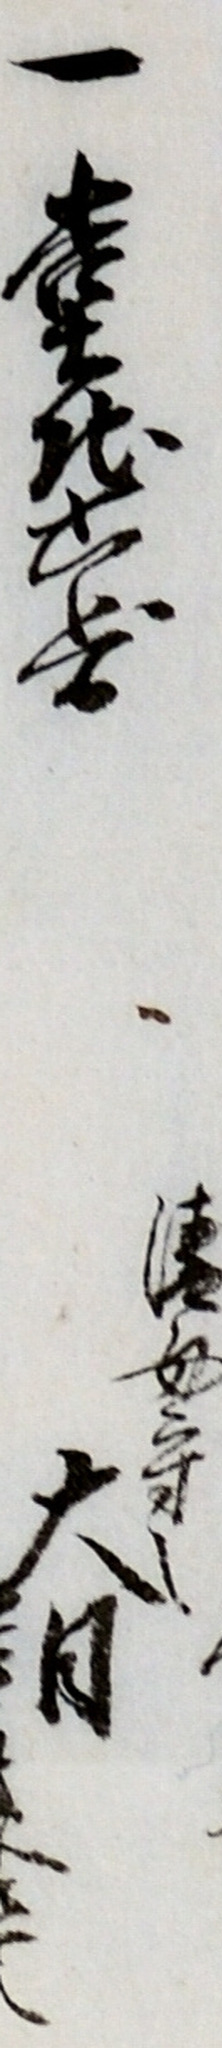一堂地六歩大日
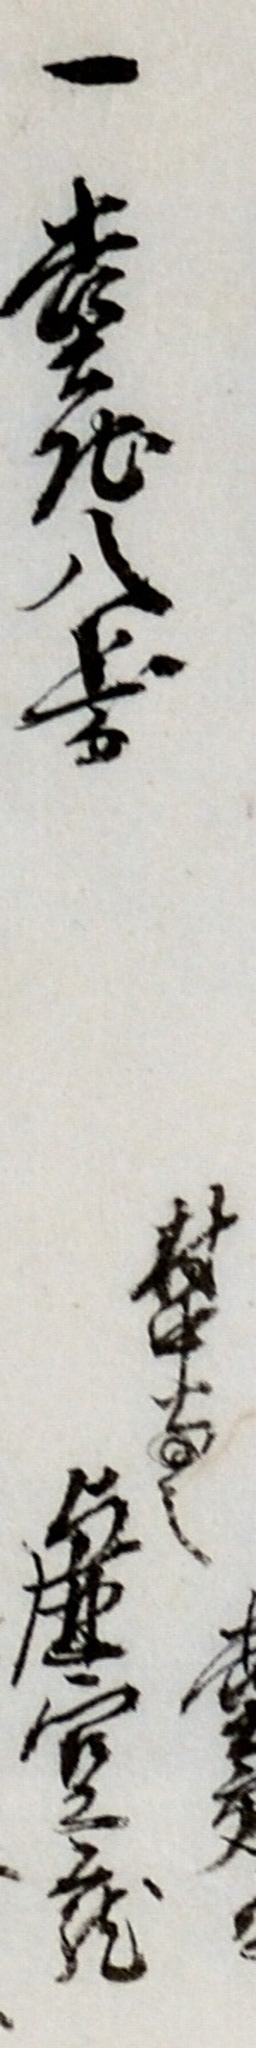一堂地八歩虚空蔵
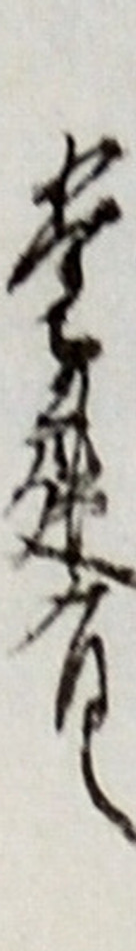堂建有之
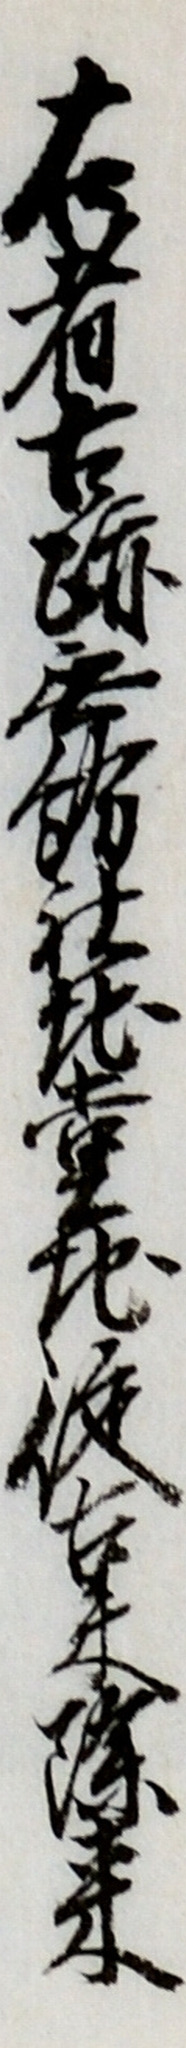右者古跡無粉社地堂地古来除来
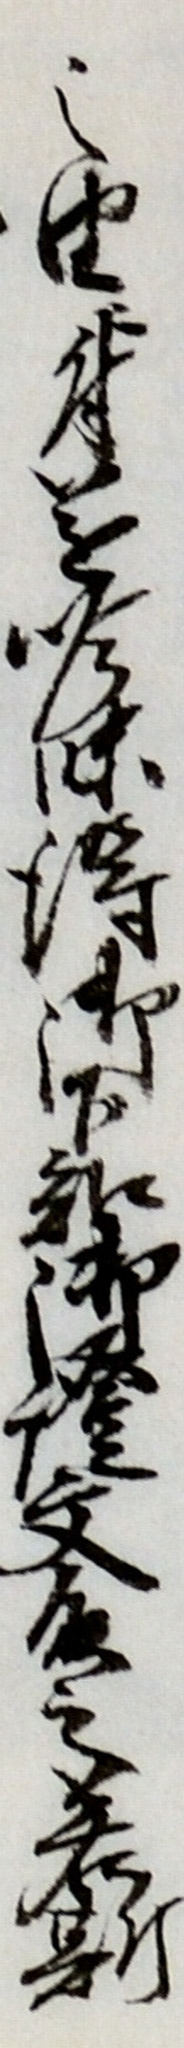之由ニ付進吟味得御下知御証文取之若斯
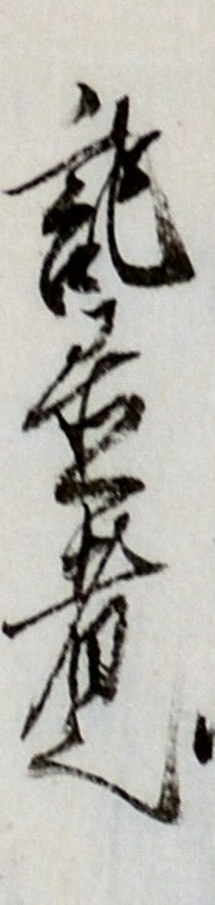記置者也
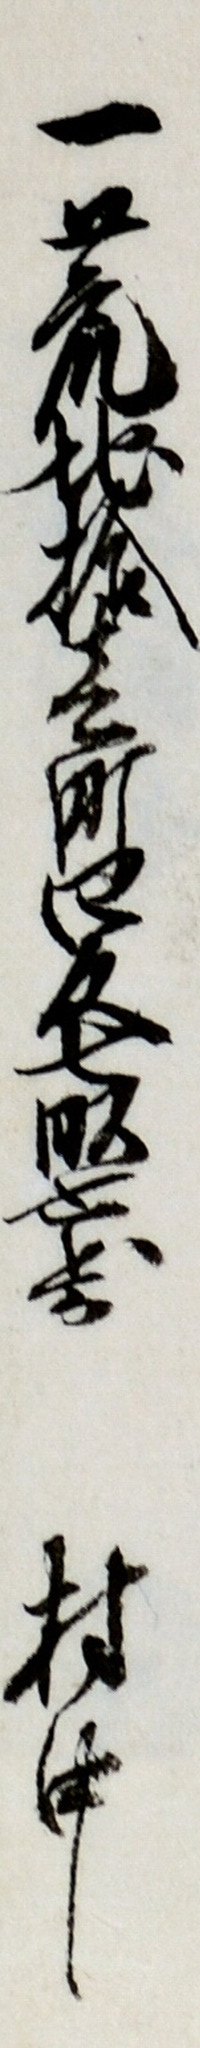一荒地拾壱町四反七畝六歩村中
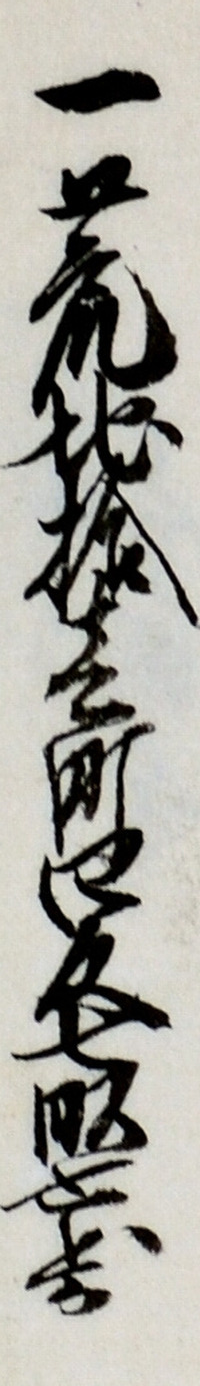一荒地拾壱町四反七畝六歩村中
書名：御領分中山林社地手控
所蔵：伊那市立高遠町図書館・合同会社AMANE
